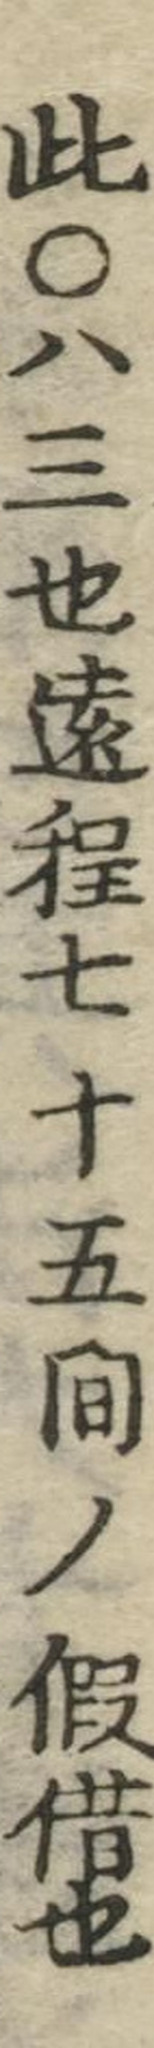此○ハ三也遠程七十五間ノ仮借也
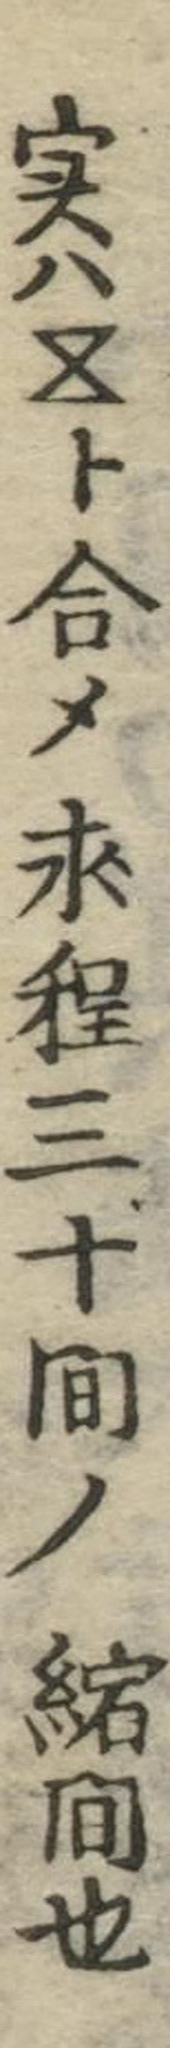実ハ▽△ト合メ求程三十間ノ縮間也
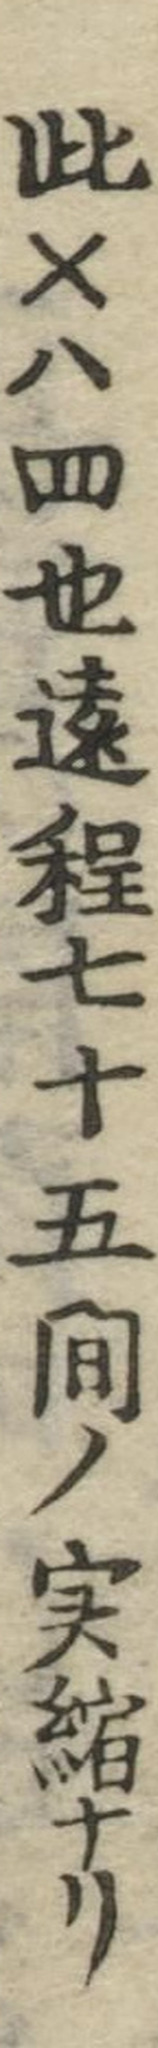此✕ハ四也遠程七十五間ノ実縮ナリ
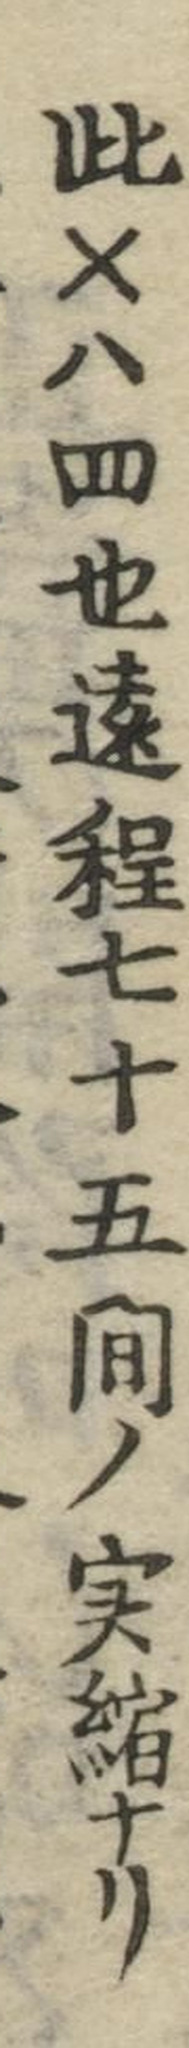此✕ハ四也遠程七十五間ノ実縮ナリ
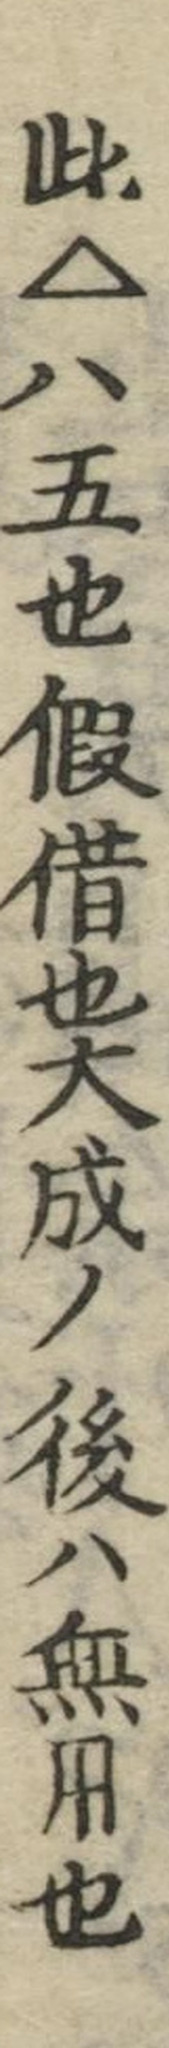此△ハ五也仮借也大成ノ後ハ無用也
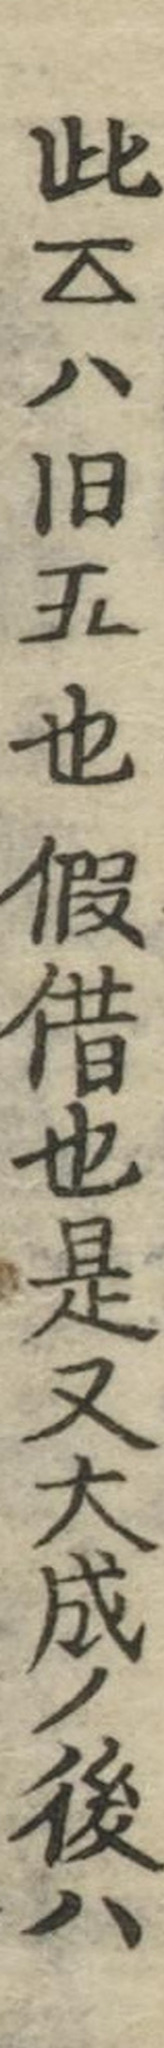此△ハ旧五也仮借也是又大成ノ後ハ
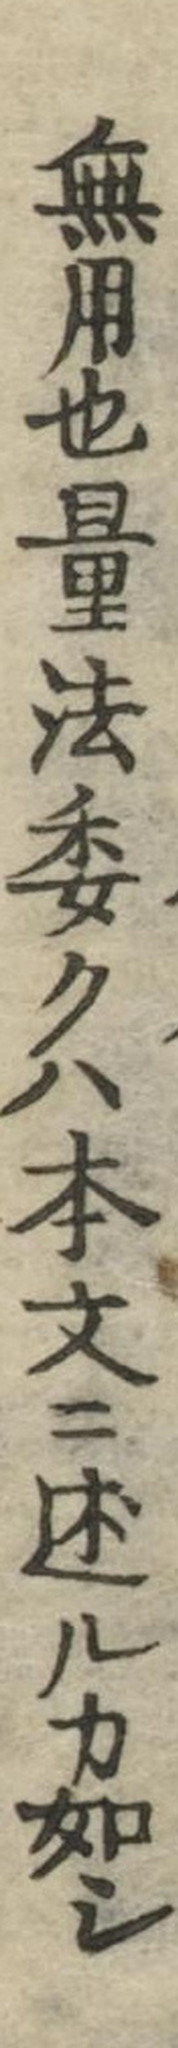無用也量法委クハ本文ニ述ルカ如シ

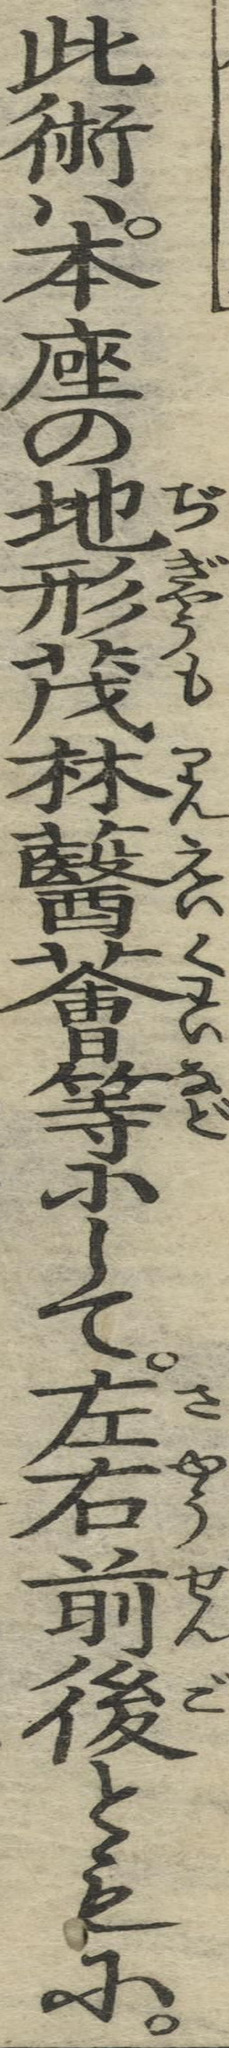此術は。本座の地形茂林蘙薈等にして。左右前後ともに。
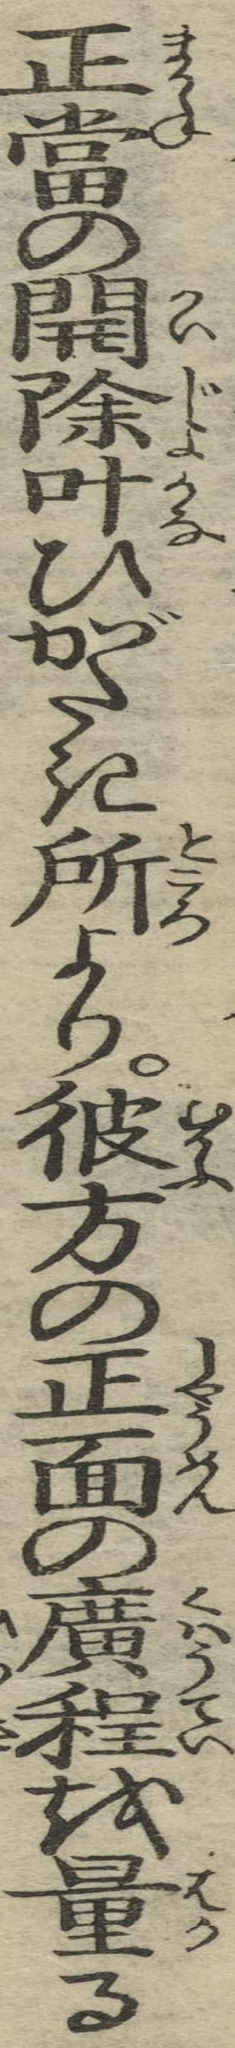正當の開除叶ひがたき所より。彼方の正面の広程を量る
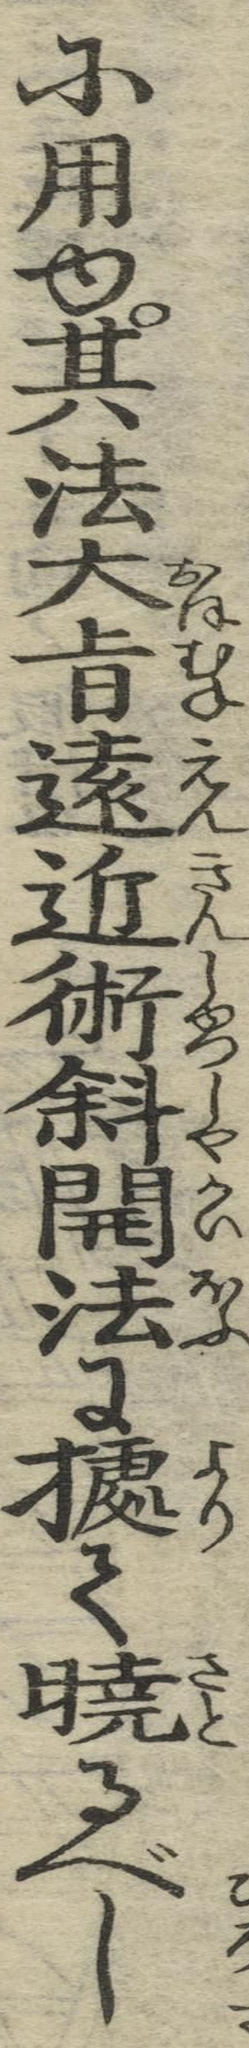に用ゆ。其法大旨遠近術斜開法に拠て暁るべし
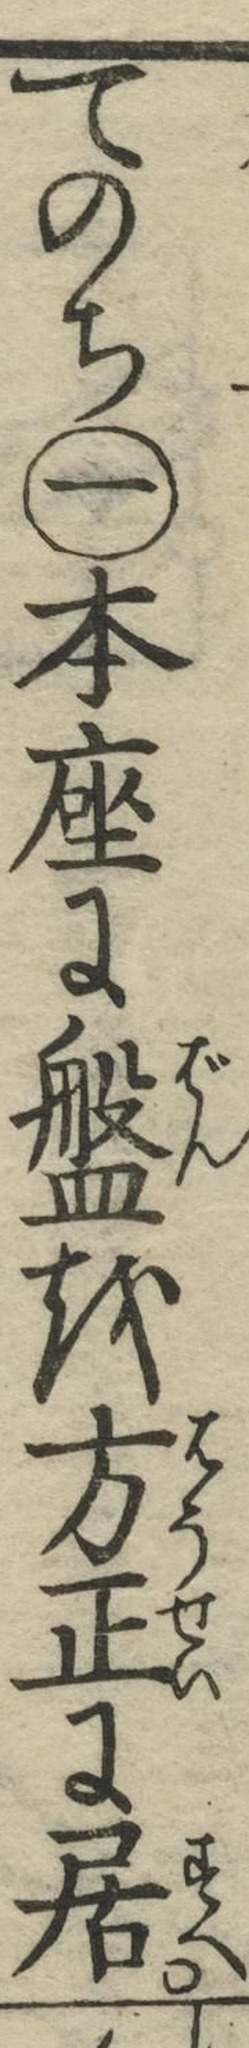てのち㊀本座に盤を方正に居。
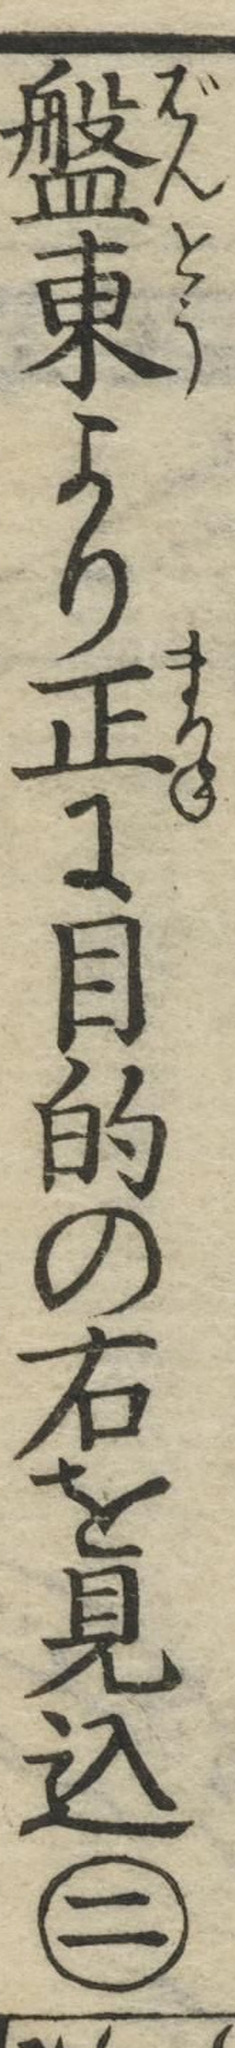盤東より正に目的の右を見込㋥
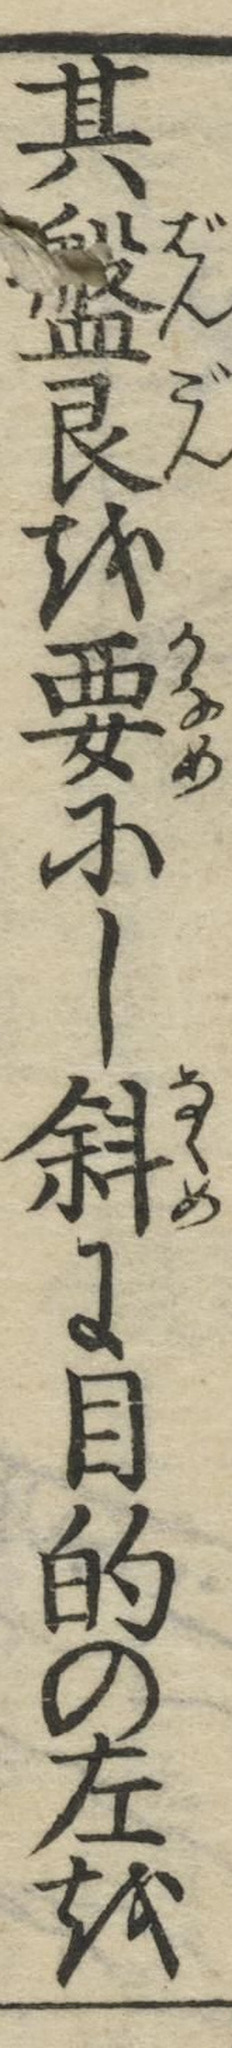其盤艮を要にし斜に目的の左を
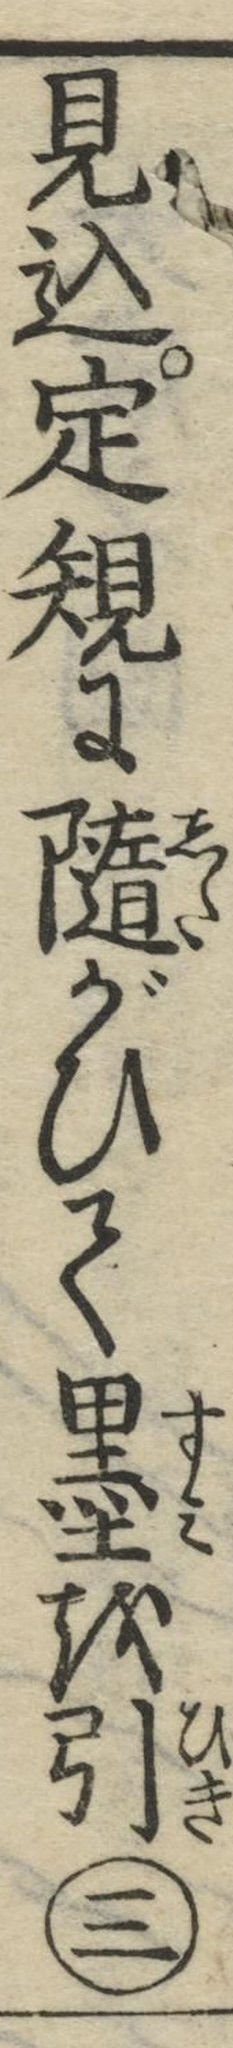見込。定規に随がひて墨を引㊂
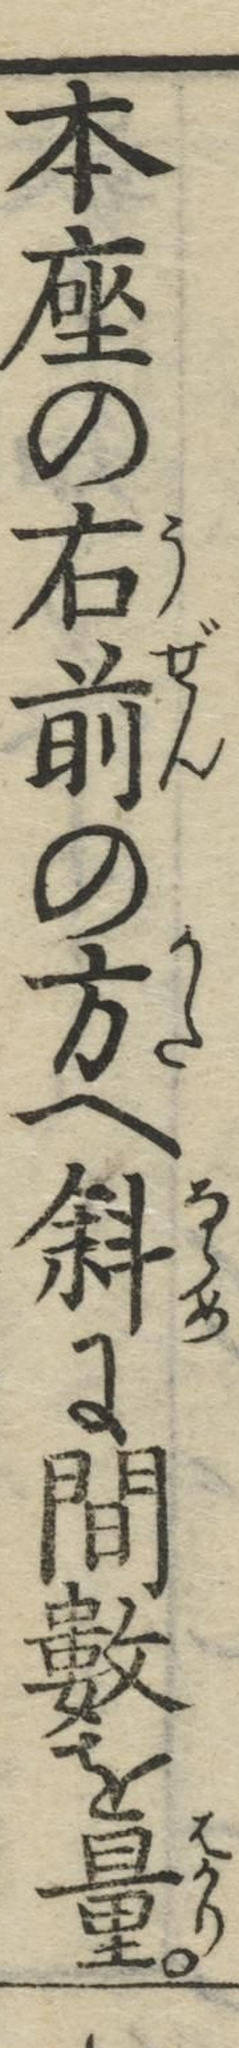本座の右前の方へ斜に間数を量。
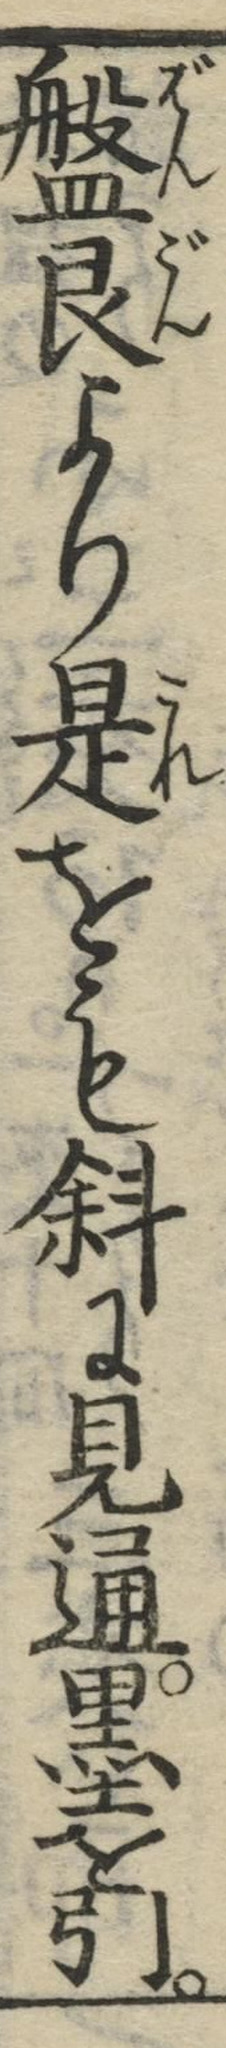盤艮より是をも斜に見通。墨を引。
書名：量地指南　巻之三（内題）
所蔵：東京大学地震研究所図書室 Earthquake Research Institute Library, The University of Tokyo, JAPAN
